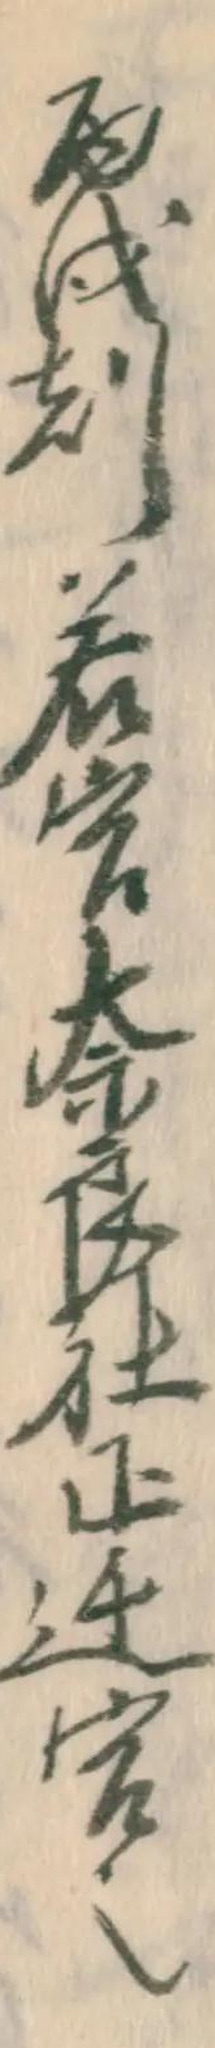酉戌刻若宮奈良社正遷宮也
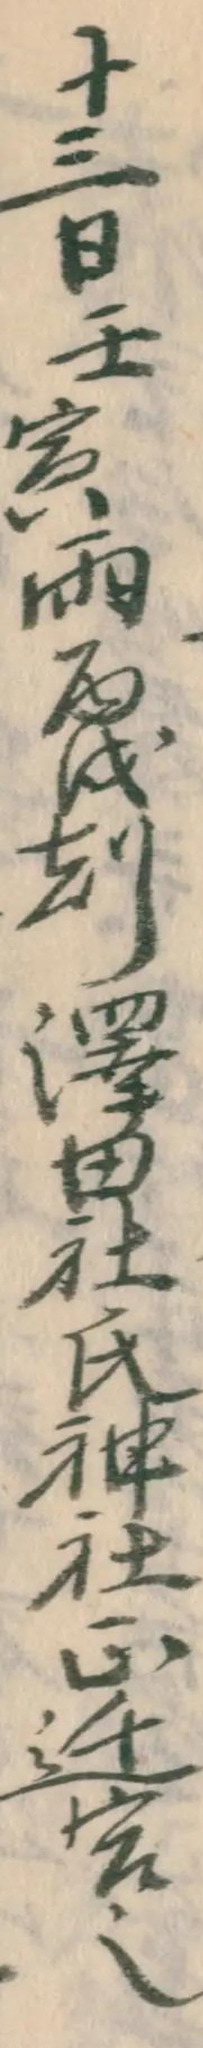十三日壬寅雨酉戌刻澤田社氏神社正遷宮也
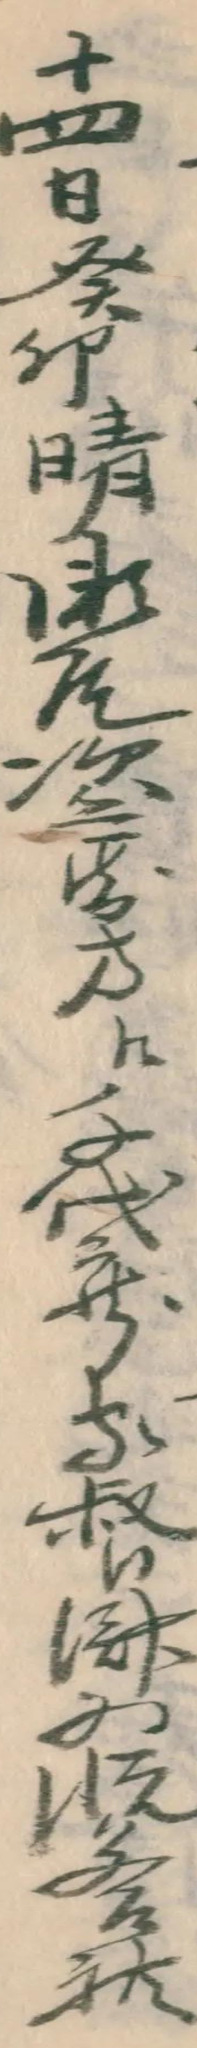十四日癸卯晴瀬尾次兵衛方え手代蔵家督済為祝答禮
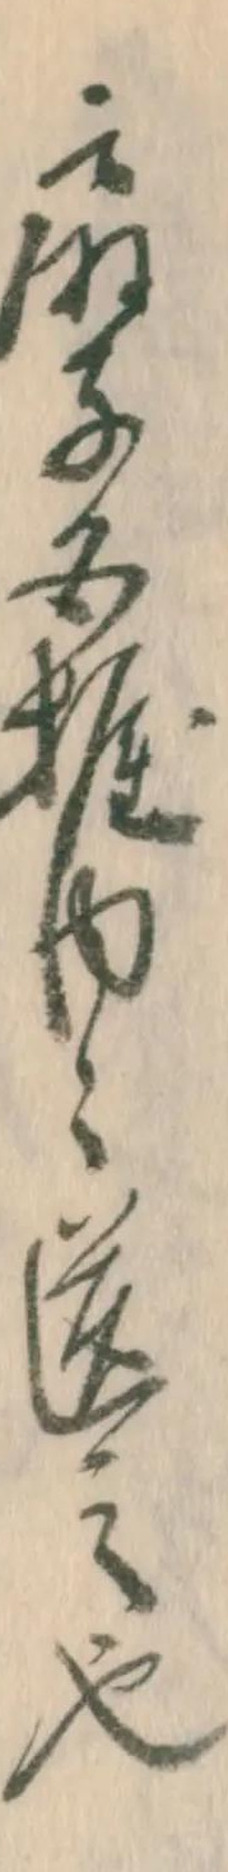扇子五握内々送之也
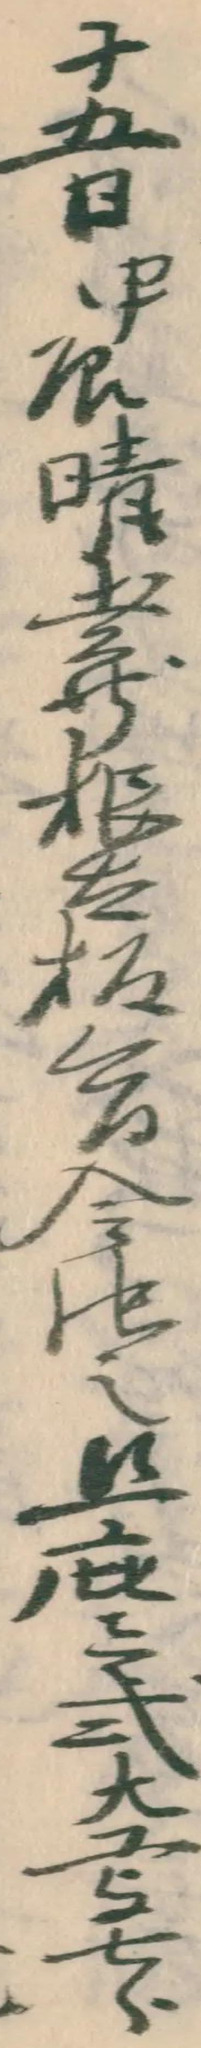十五日甲辰晴土蔵根太板今日令張之且庇壱弐大工与七郎
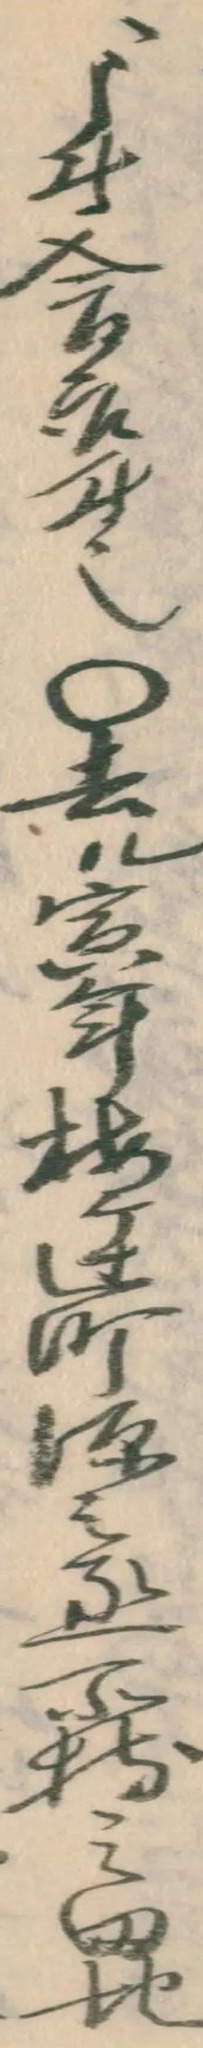へ申付今日取付也○去ル寅年梅ケ辻町源之丞所持之田地
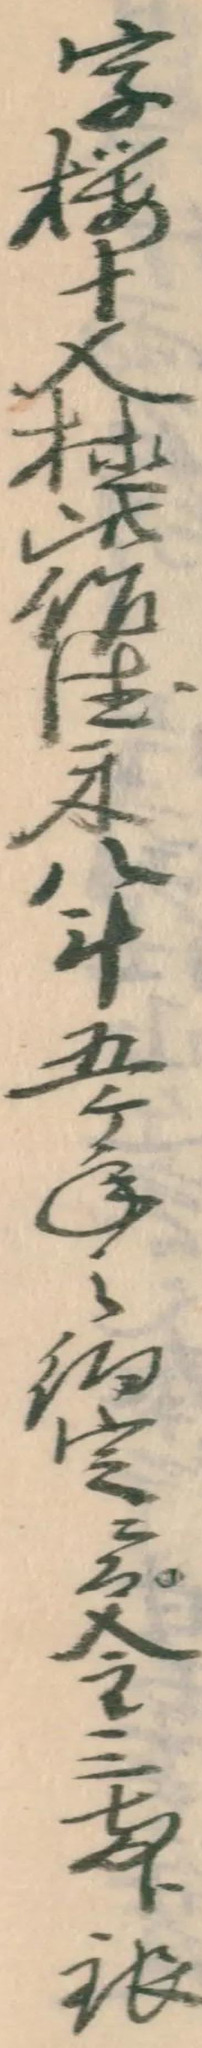字桜十人植此作徳米八斗五ヶ年之約定ニ而金三両ト銀
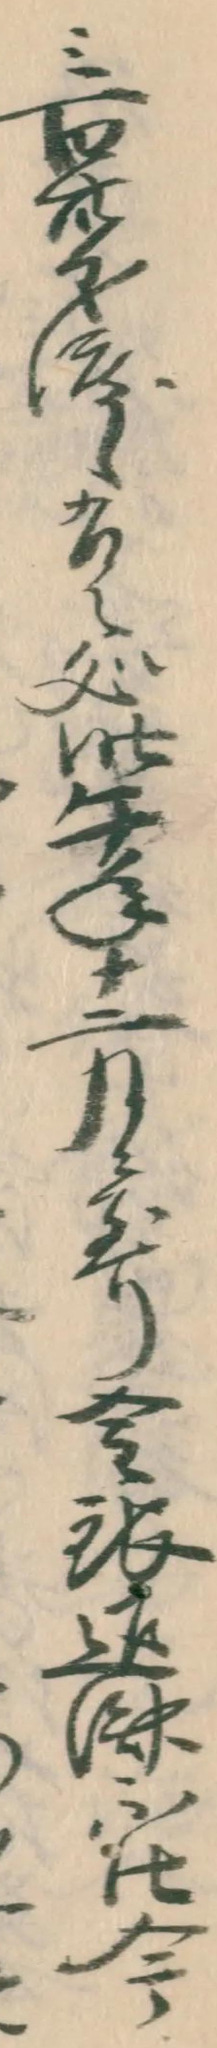三百廿本渡候有之処昨午年十二月ニ至り金銀返済不仕今
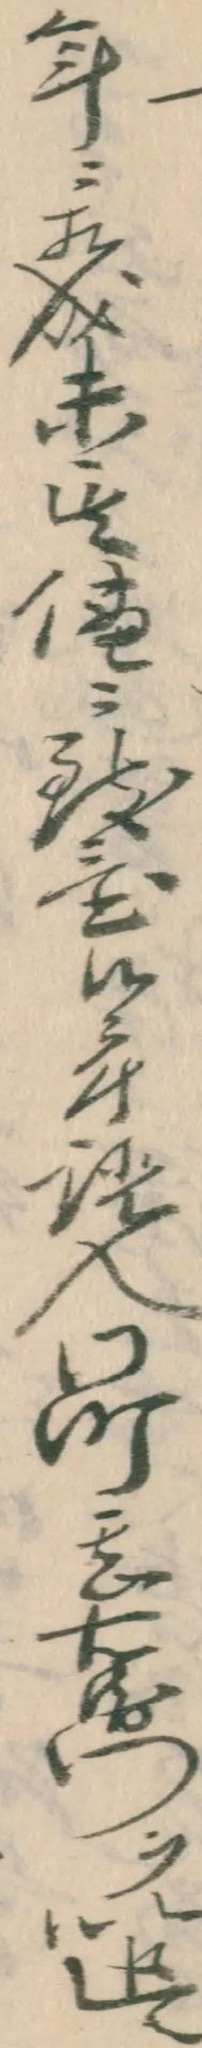年に相成未其儘ニ致置候ニ付詫入同町甚右衛門を以追々
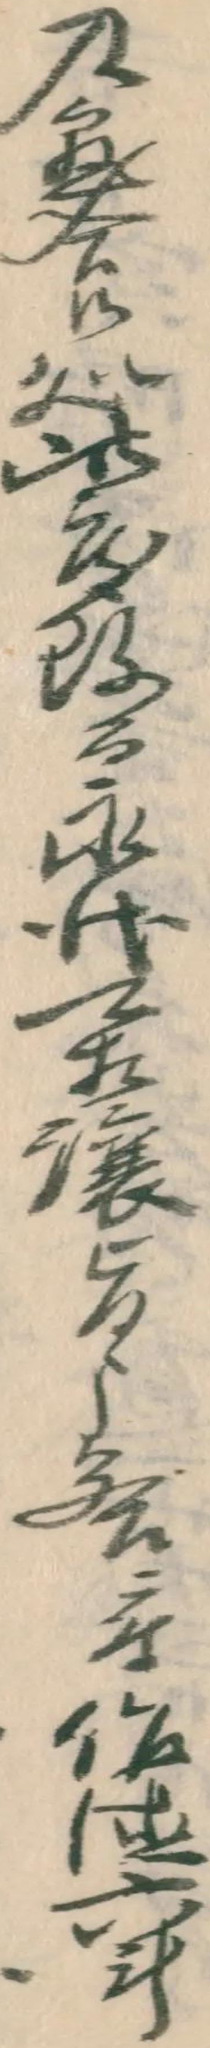及懸合候処此度改而永代可相譲旨申答ニ付作徳六斗
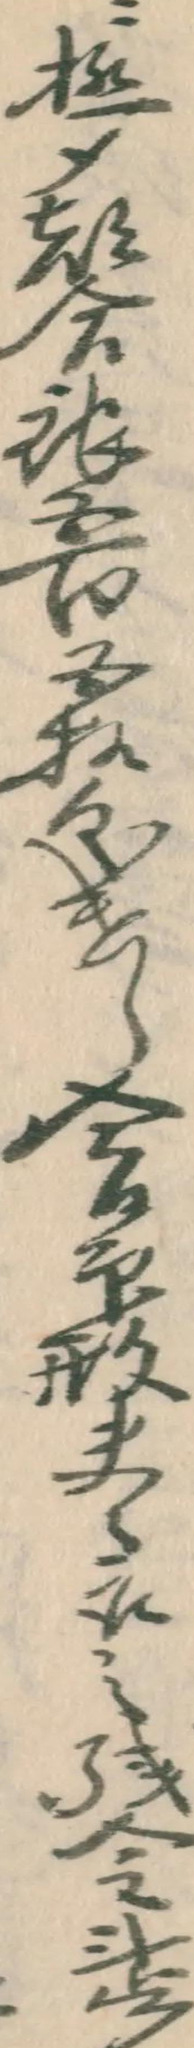ニ極メ都合銀五百五拾匁遣し今日印形夫々取之残金弐歩
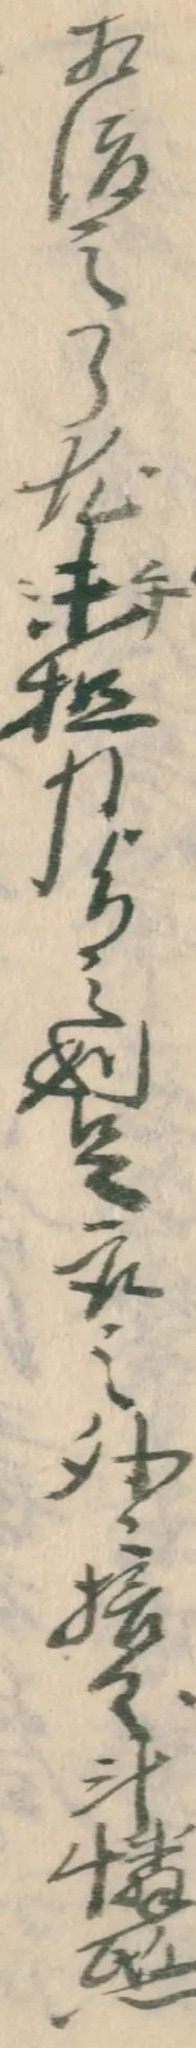相渡之了尤午組月より之判足取之外に拾匁計憐愍
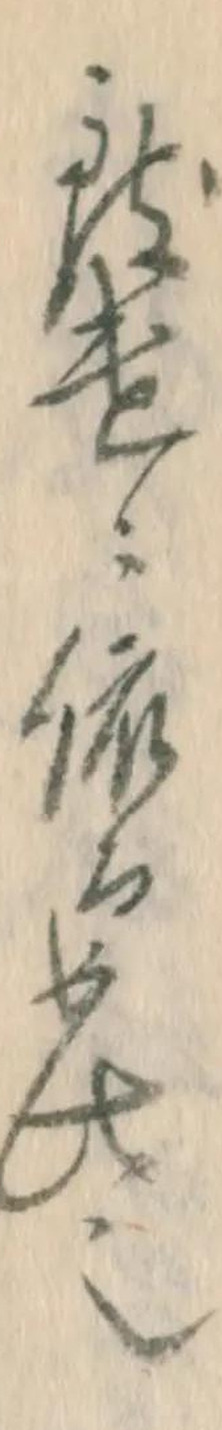致遣候依而如此也
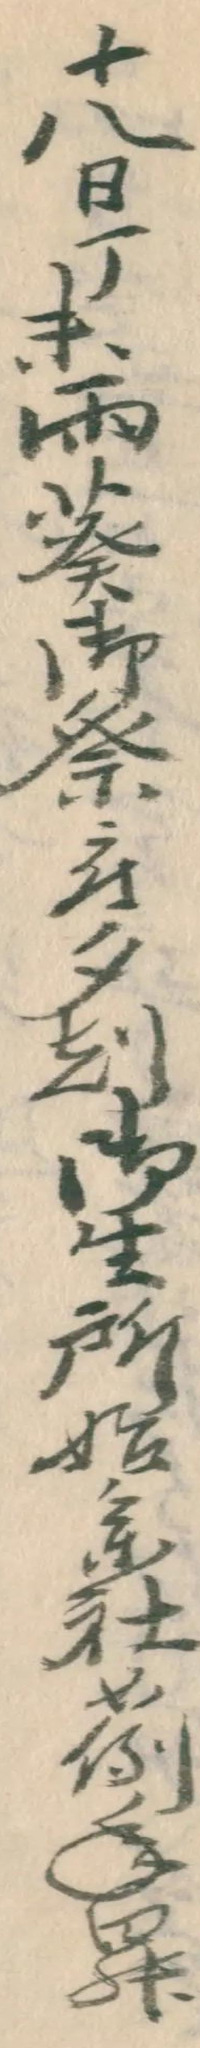十八日丁未雨葵御祭ニ付夕刻御生所始参社如例年昇
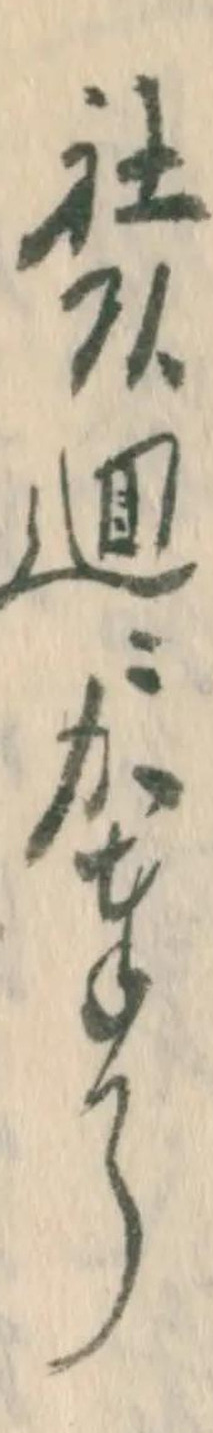社頭廻ニ加奉了
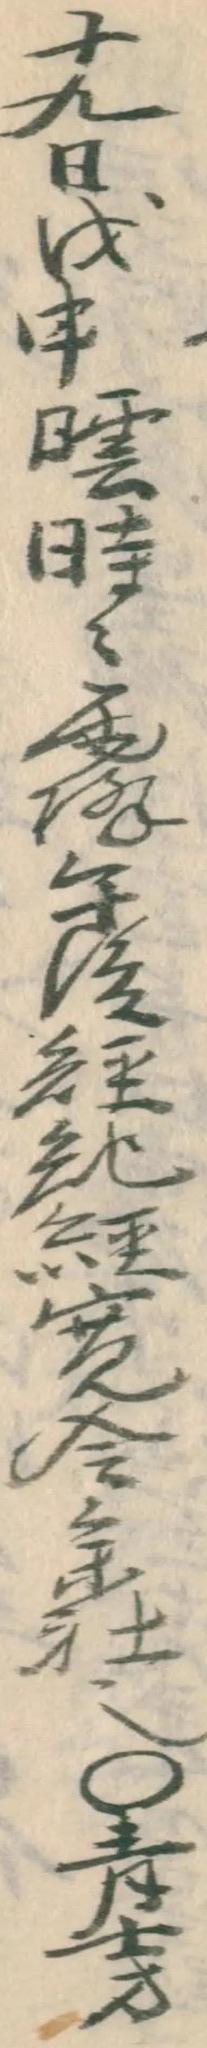十九日戊申曇時々雨降午後経紀経寛令参社也○青士方
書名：賀茂社記録. 第67冊
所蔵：国立国会図書館 National Diet Library, JAPAN
